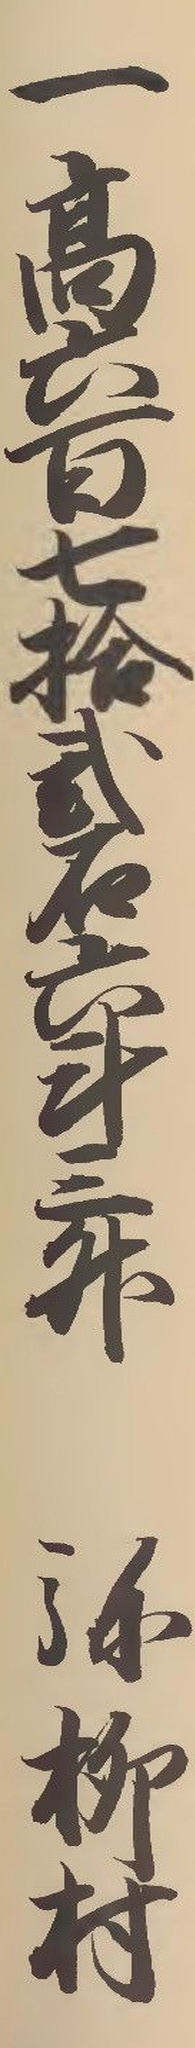一高六百七拾弐石六斗三升弥柳村
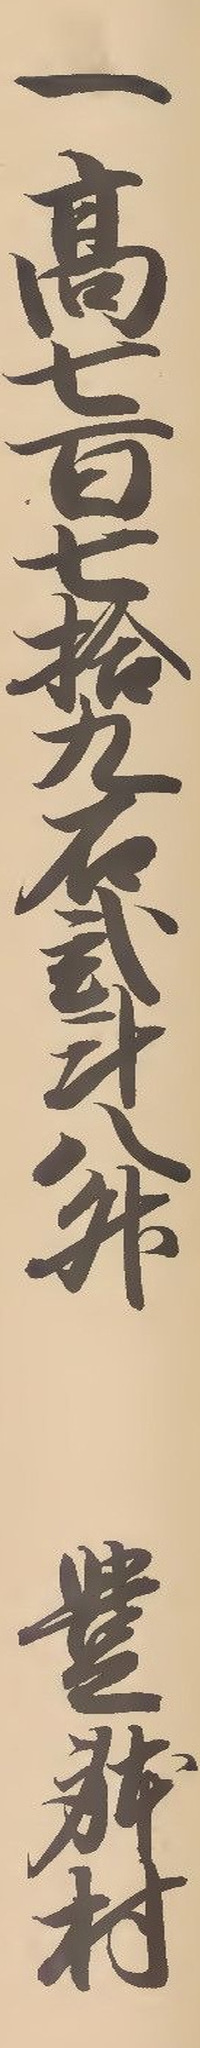一高七百七拾九石弐斗八升豊躰村
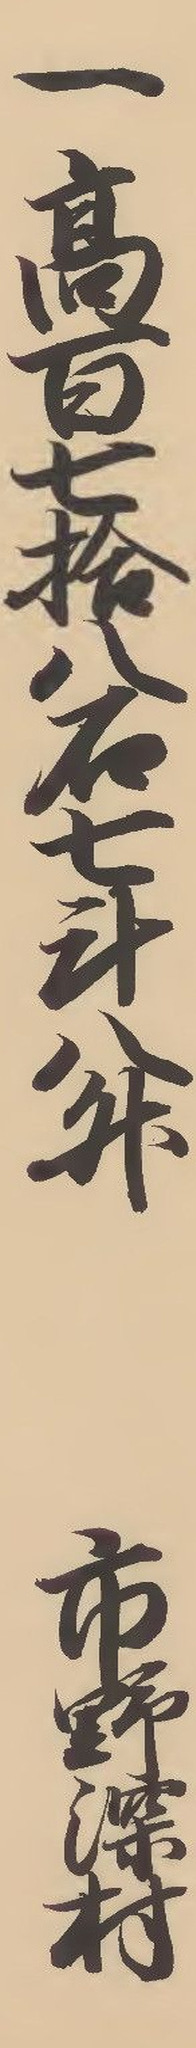一高百七拾八石七斗八升市野深村
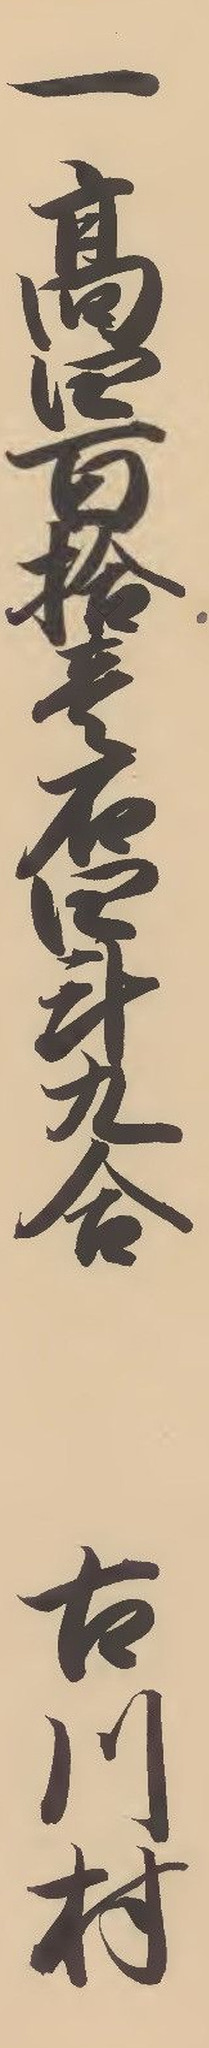一高四百拾壱石四斗九合古川村
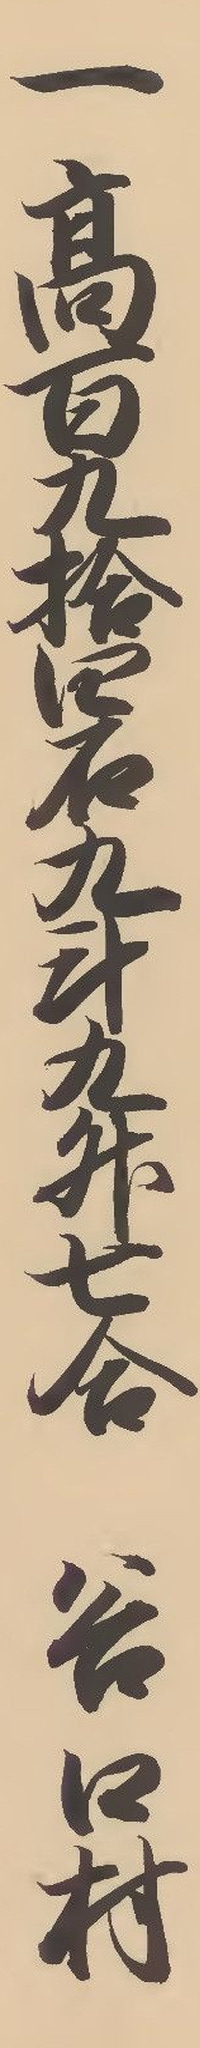一高百九拾四石九斗九升七合谷口村

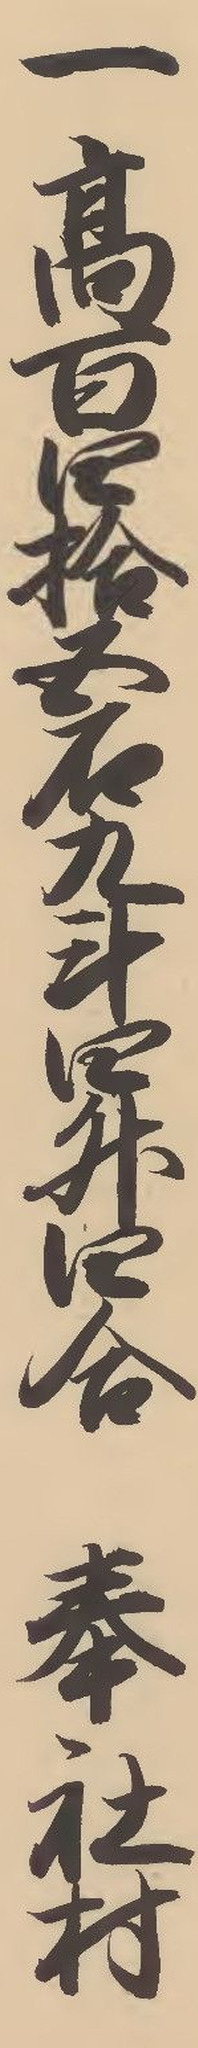一高百四拾五石九斗四升四合奉社村
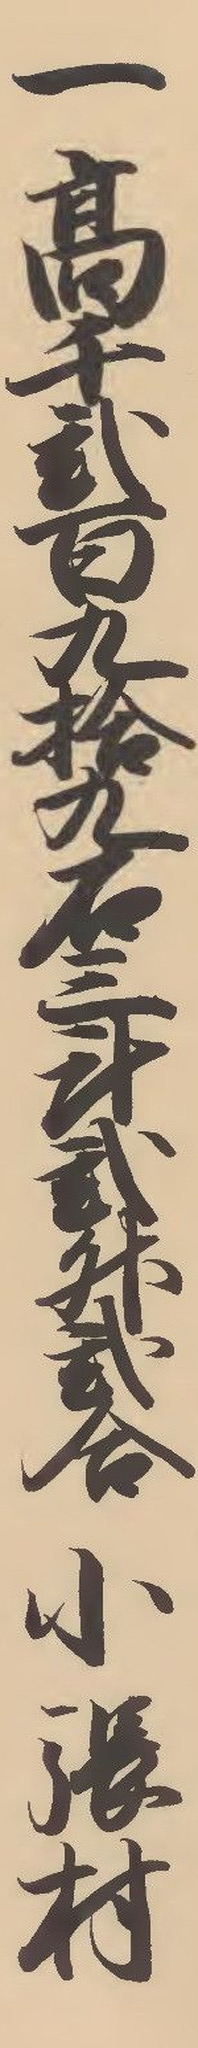一高千弐百九拾九石三斗弐升弐合小張村
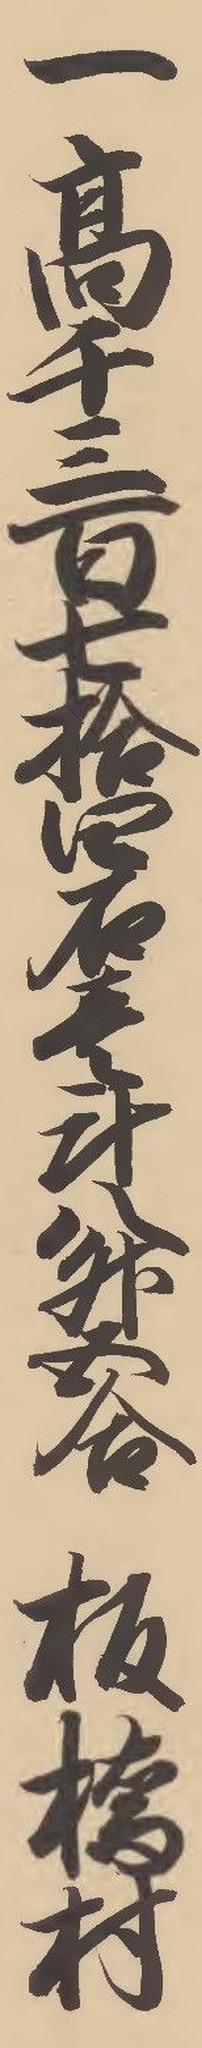一高千三百七拾四石壱斗八升五合板橋村
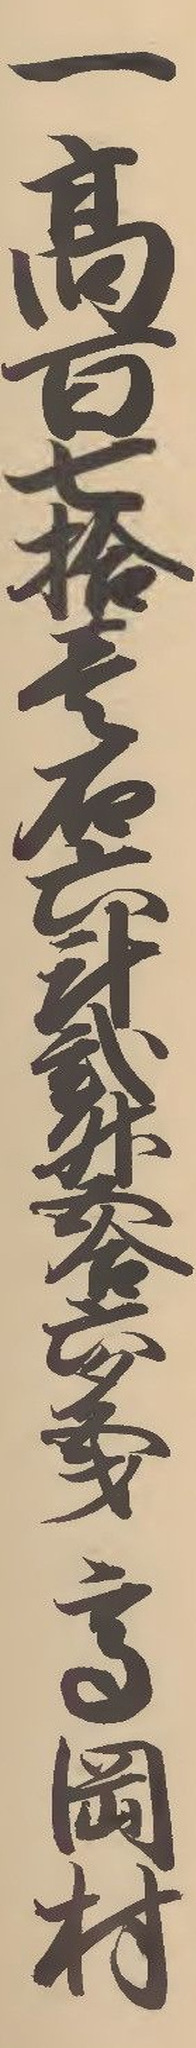一高百七拾壱石六斗弐升五合六勺五才高岡村
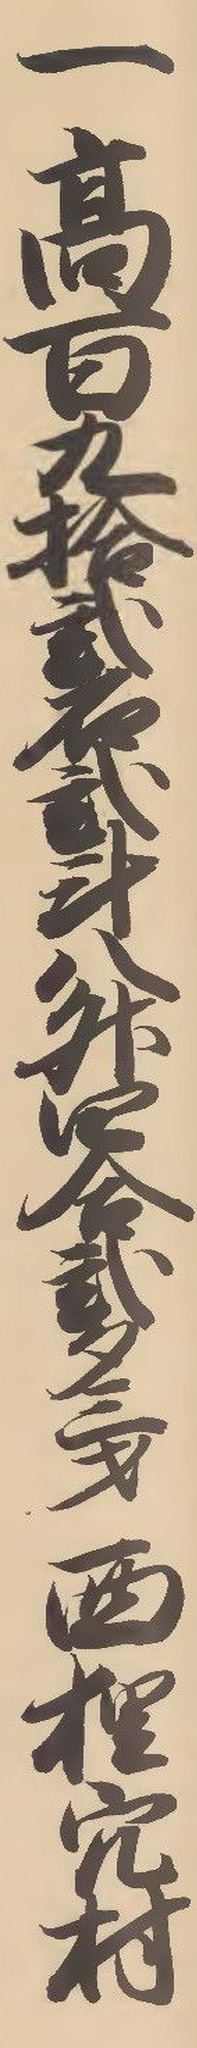一高百九拾弐石弐斗八升四合弐勺三才西狸穴村
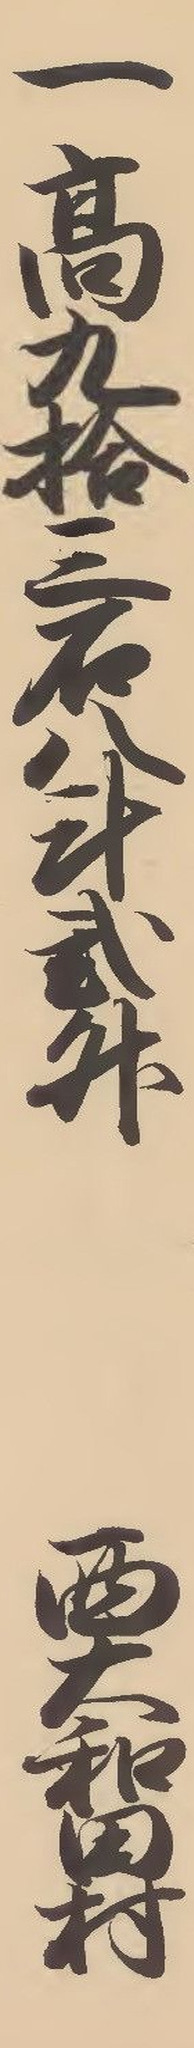一高九拾三石八斗弐升西大和田村
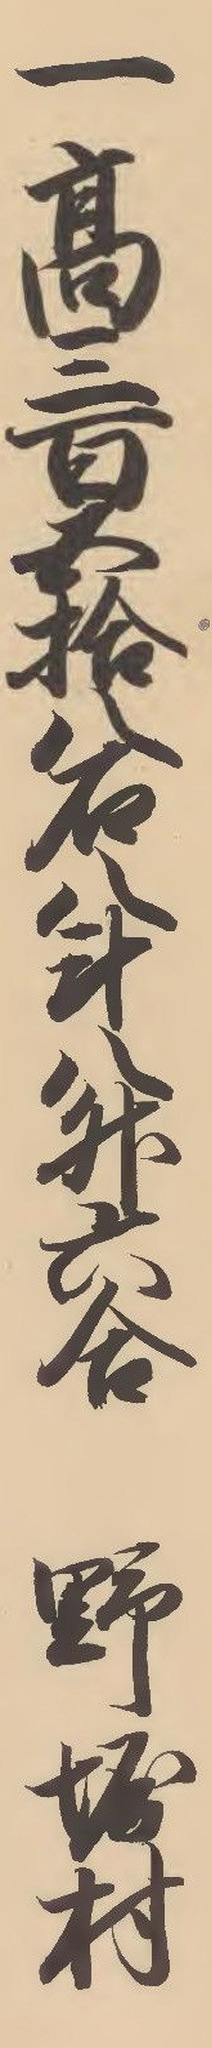一高三百五拾八石八斗八升六合野堀村
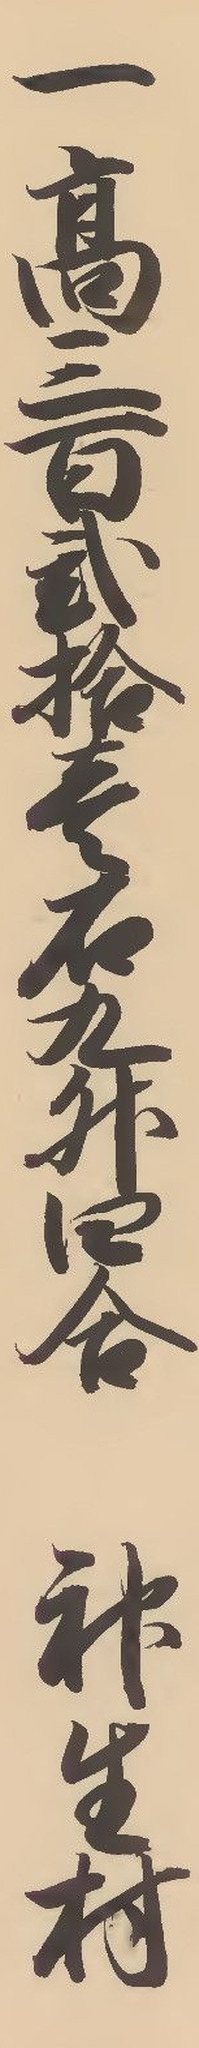一高三百弐拾壱石九升四合神生村

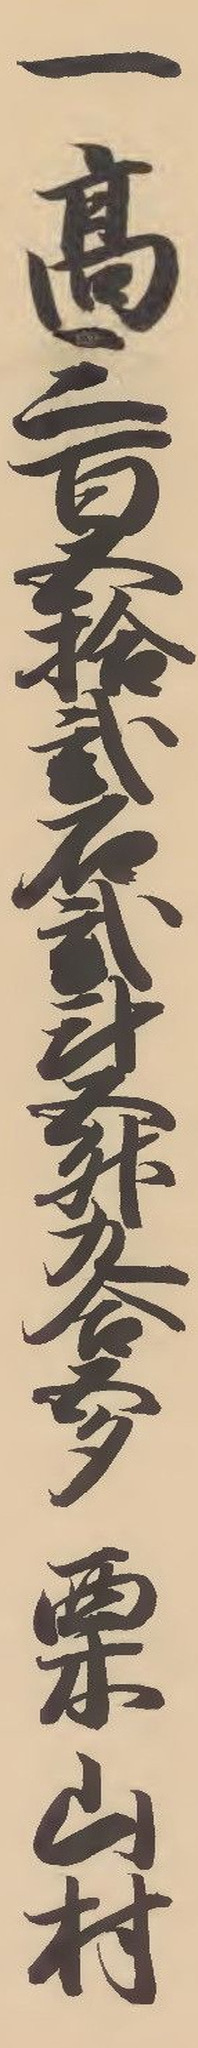一高三百五拾弐石弐斗五升九合五勺栗山村
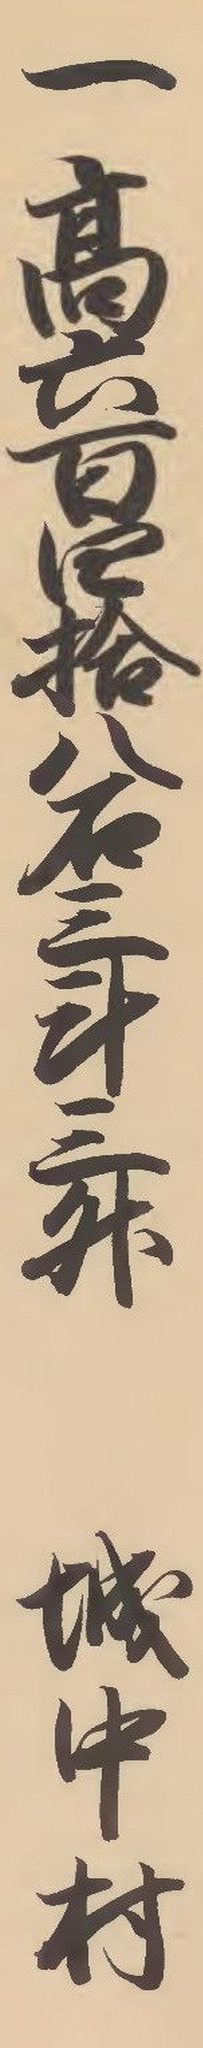一高六百四拾八石三斗三升城中村
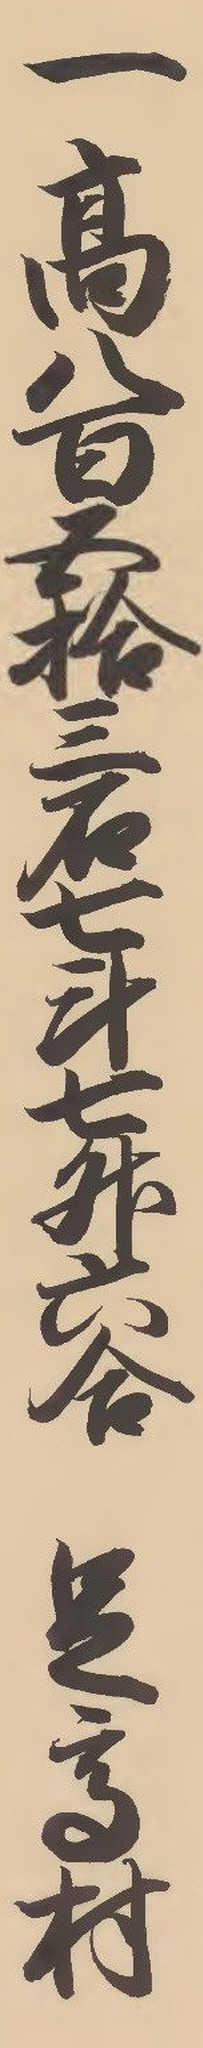一高八百五拾三石七斗七升六合足高村
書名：常陸国郷帳
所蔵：国立公文書館 National Archives of Japan
